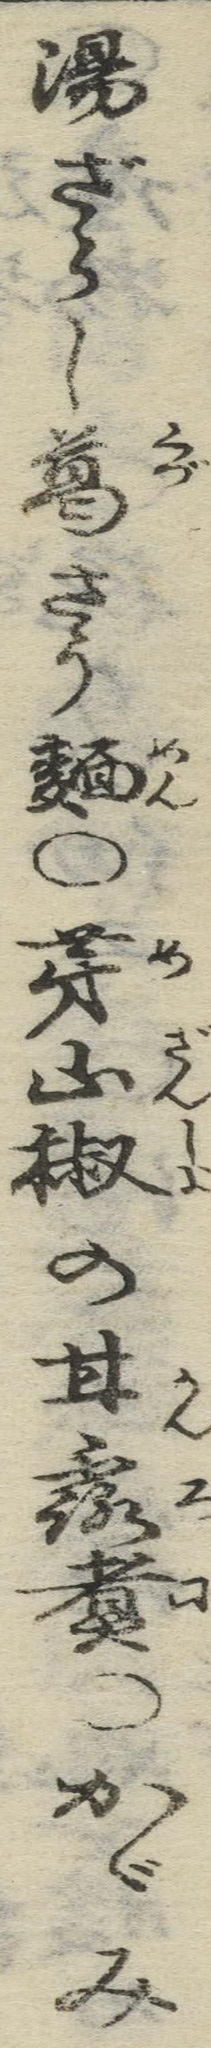湯ざらし葛さう麺○芽山椒の甘露煮○かゞみ
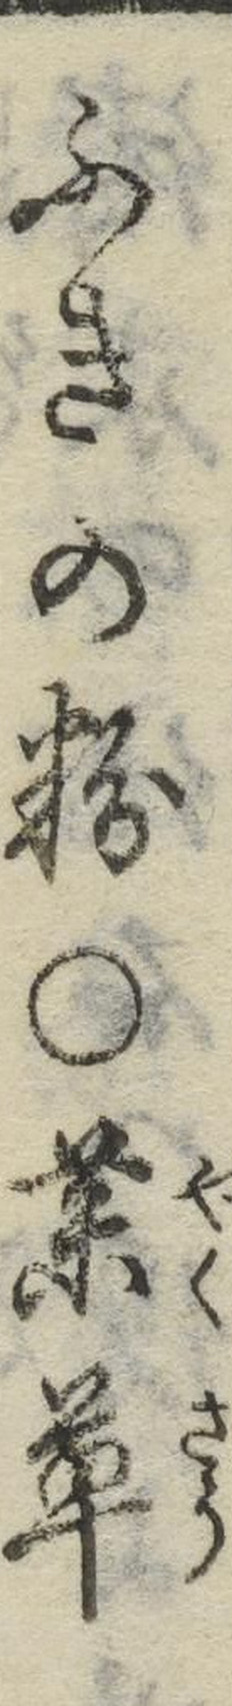ふきの粉○薬草
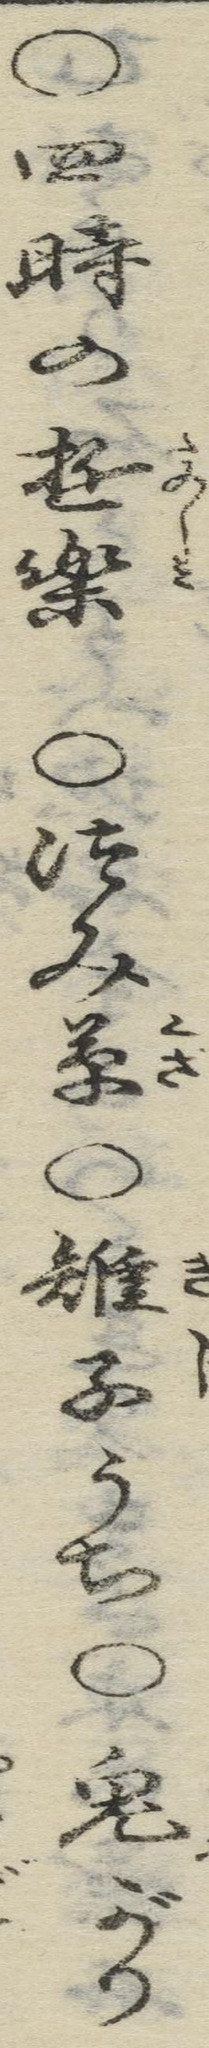○四時の遊楽○つみ草○雉うち○兎がり
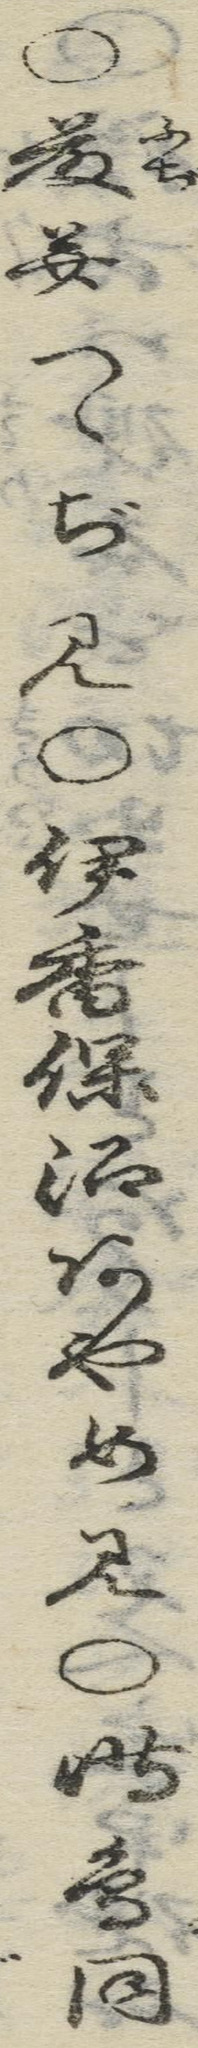○藤并つゝぢ見○伊香保沼あやめ見○時鳥同
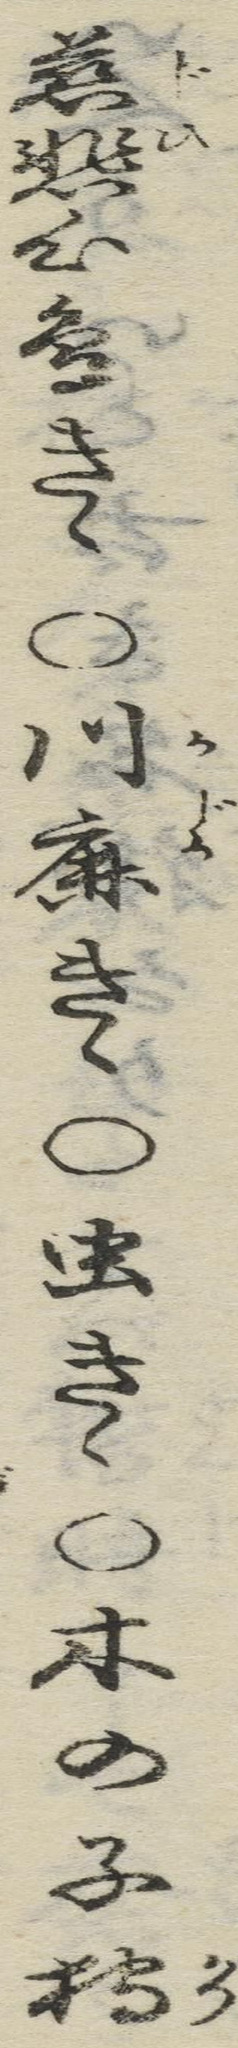慈悲心鳥きく○川鹿きく○虫きく○木の子狩
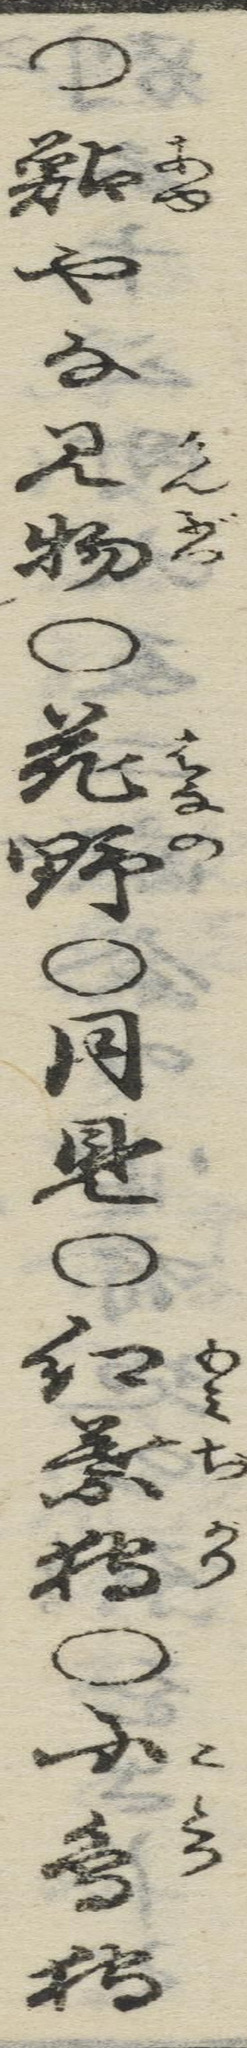○鮎やな見物○花野○月見○紅葉狩○小鳥狩
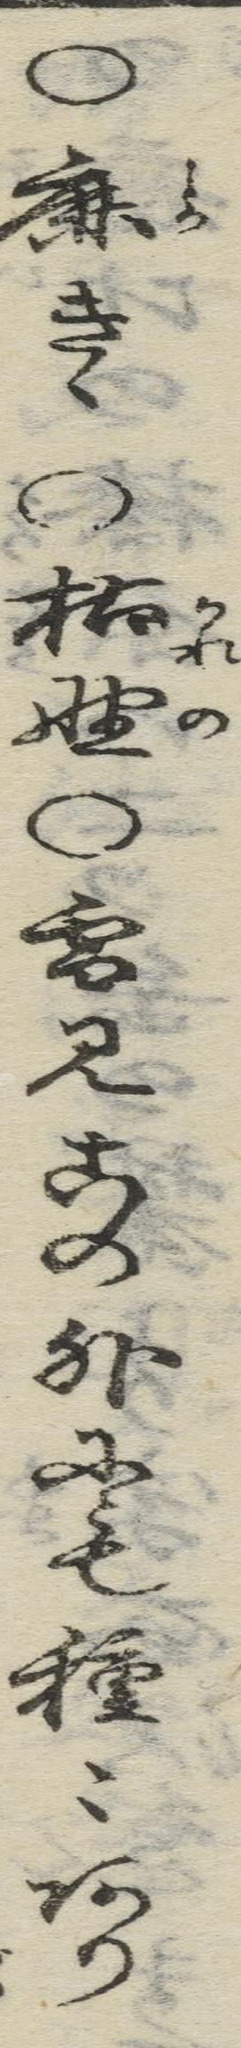○鹿きく○枯野○雪見この外にも種々あり
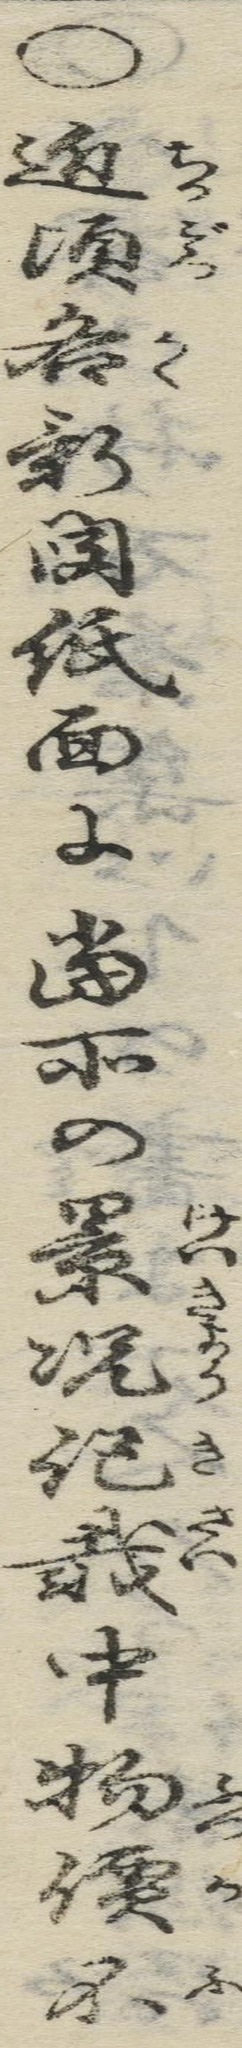○近頃各新聞紙面に当所の景況記載中物價不
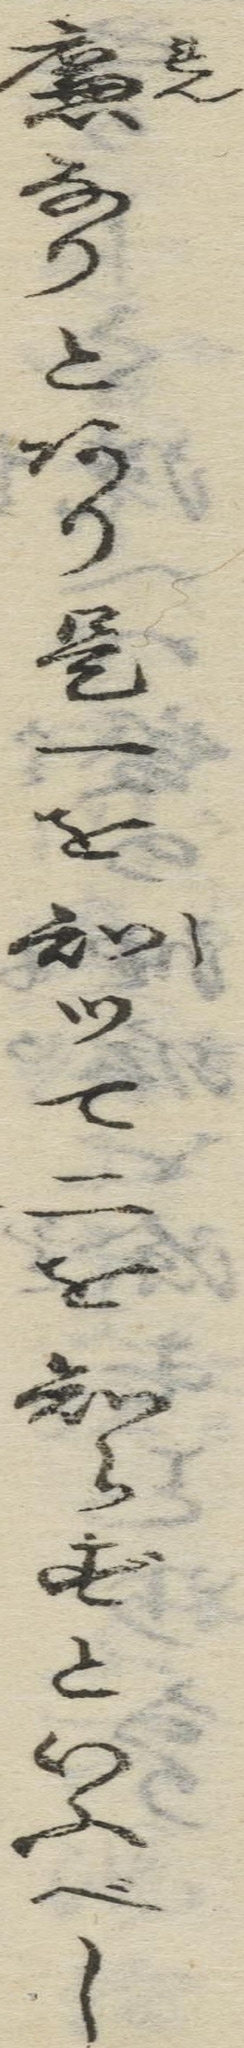廉なりとあり是一を知って二を知らずといふべし
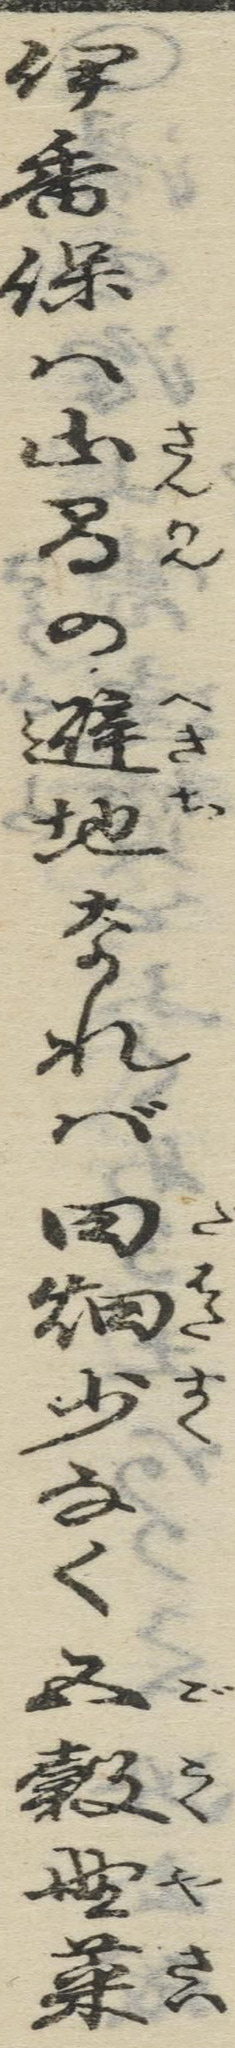伊香保は山間の避地なれば田畑少なく五穀野菜
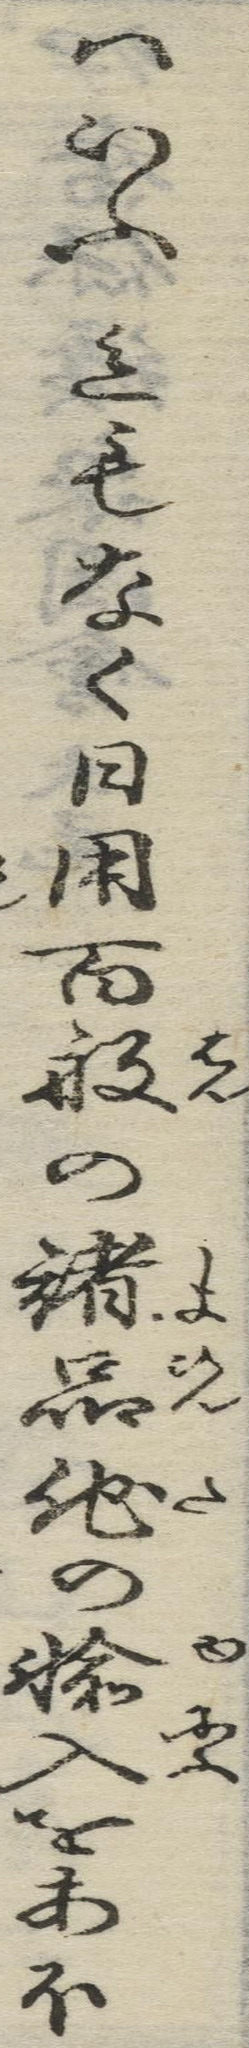はいふ迄もなく日用百般の諸品他の輸入をあほ
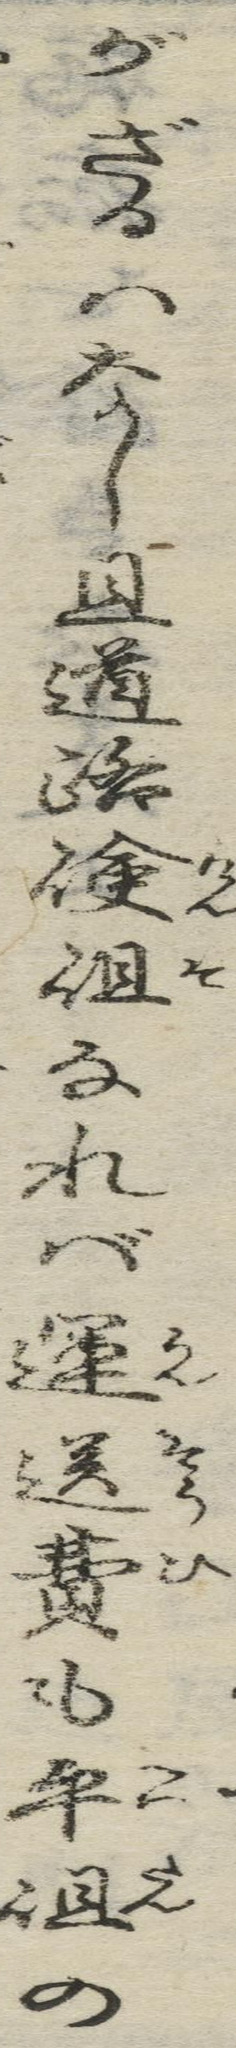がざるはなし且道路険阻なれば運送費も平坦の
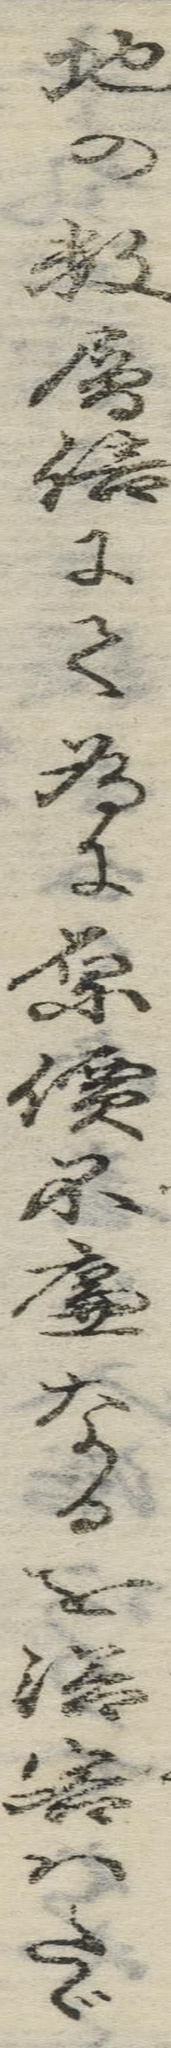地の数層倍にて為に原價不廉なるを浴客はたゞ
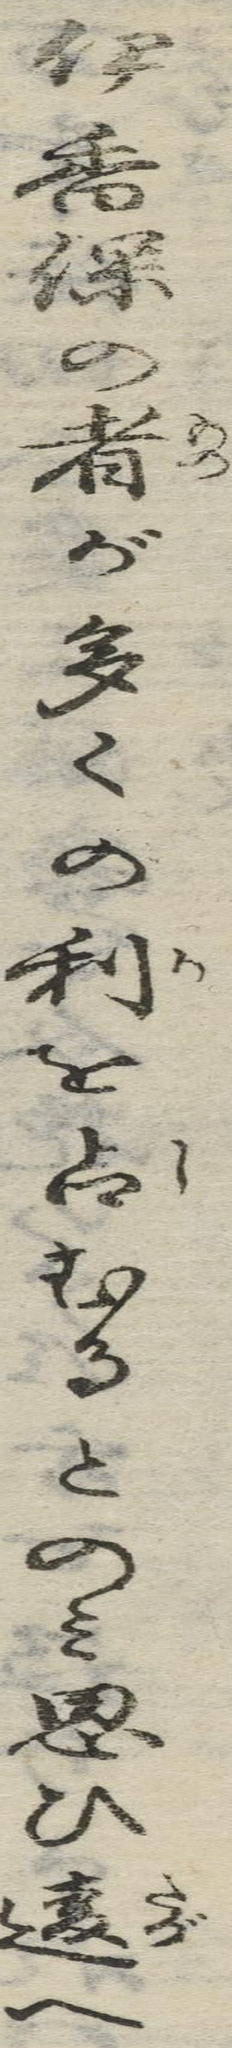伊香保の者が多くの利を占むるとのみ思ひ違へ
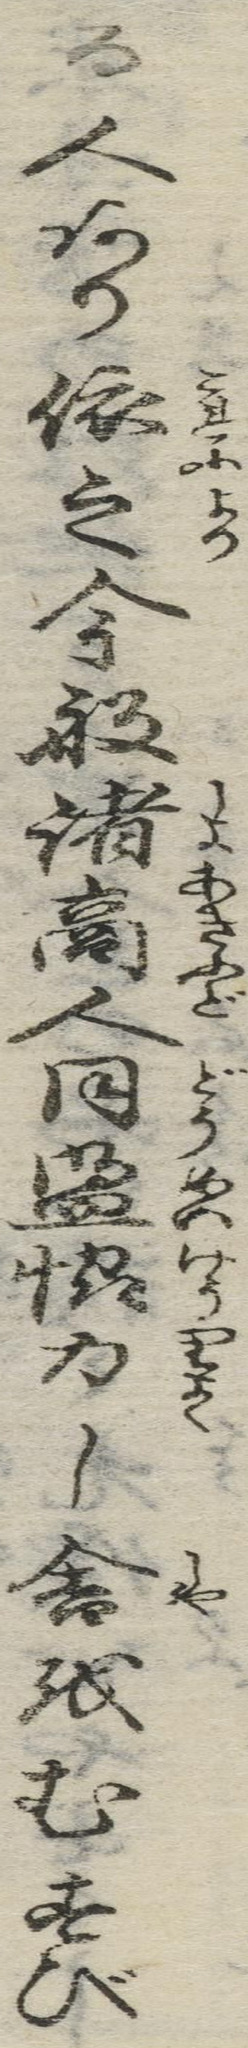る比とあり依之今般諸商人同盟協力し舎をむすび
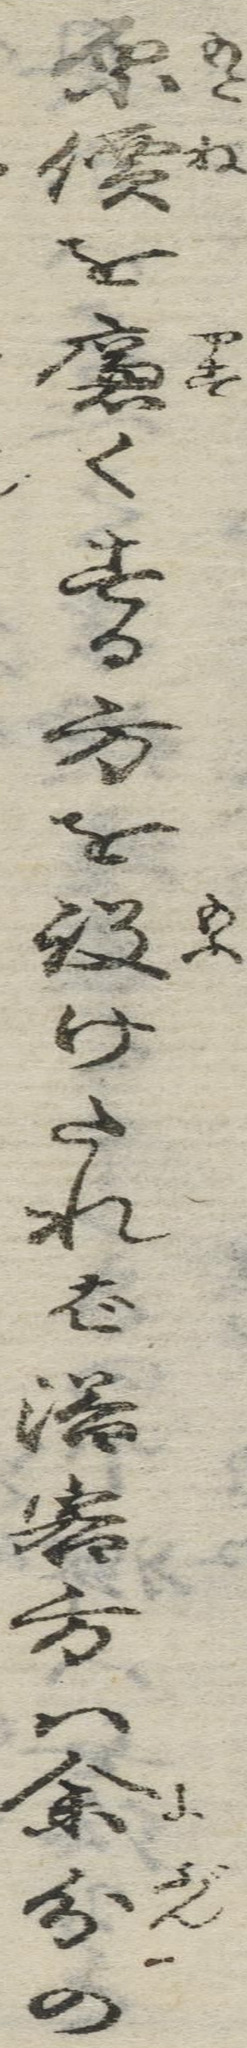原價を廉くする方を設けたれば浴客方は余分の
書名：上州伊香保鑛泉圖會　全
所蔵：東京大学地震研究所図書室 Earthquake Research Institute Library, The University of Tokyo, JAPAN
